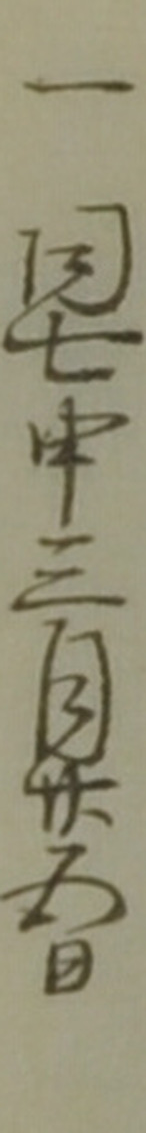一同七申三月廿五日
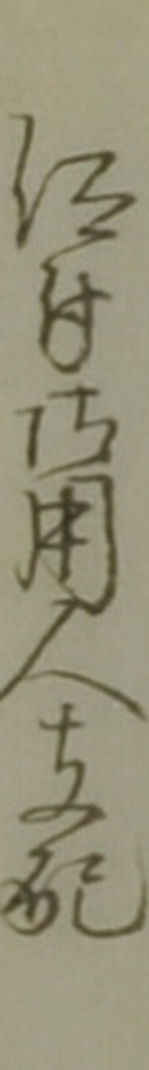仰付御用人支配
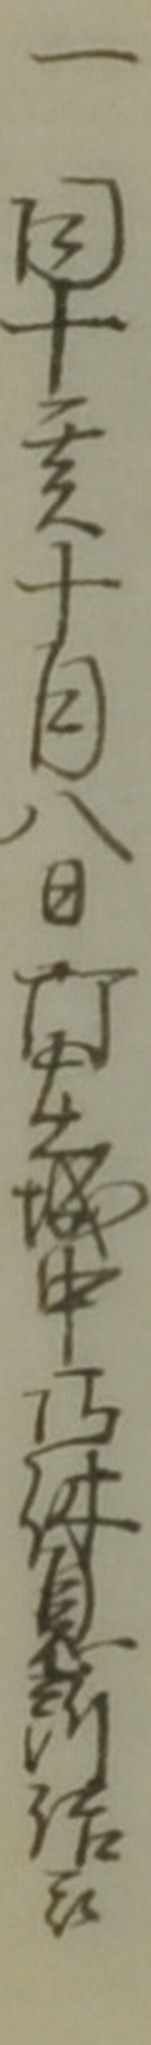一同十亥十月八日御在城中御休息所詰被
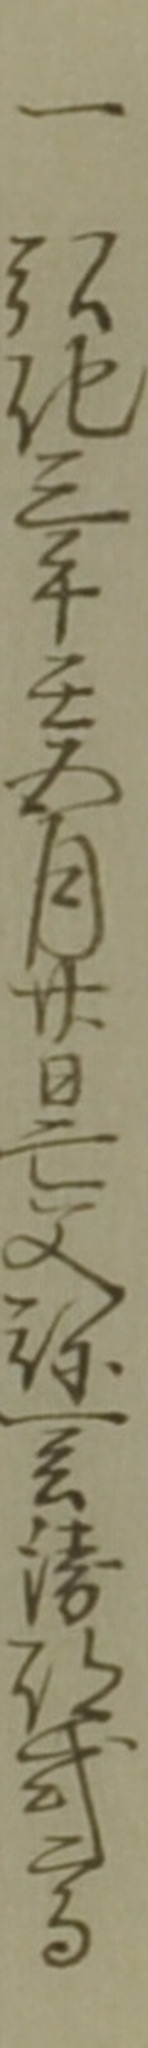一弘化三午閏五月廿日亡父弥一兵衛跡式高
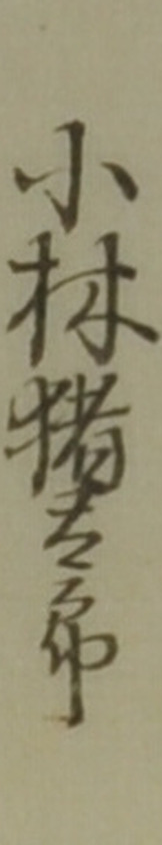小林猪太郎

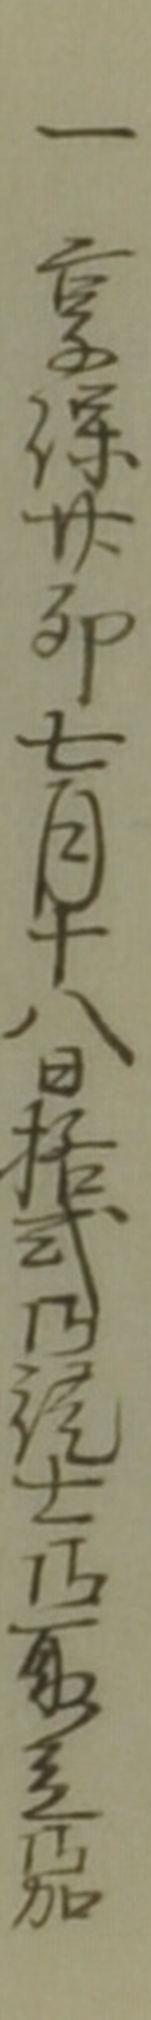一享保廿卯七月十八日格式御徒士御取立御加
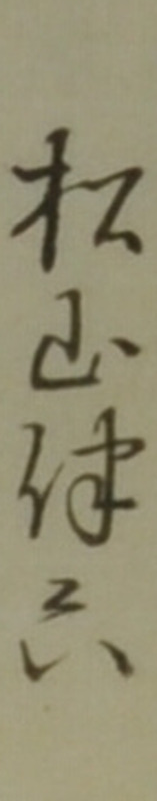松山伴六
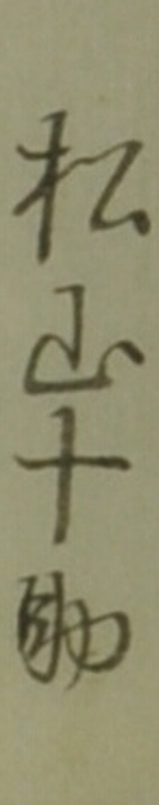松山十助

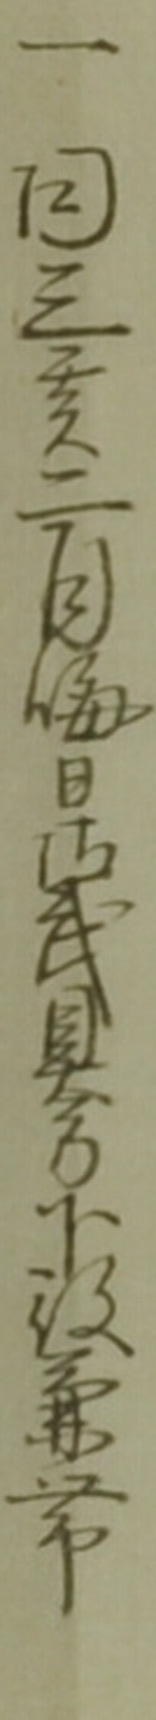一同三亥二月晦日御武具方下役兼帯
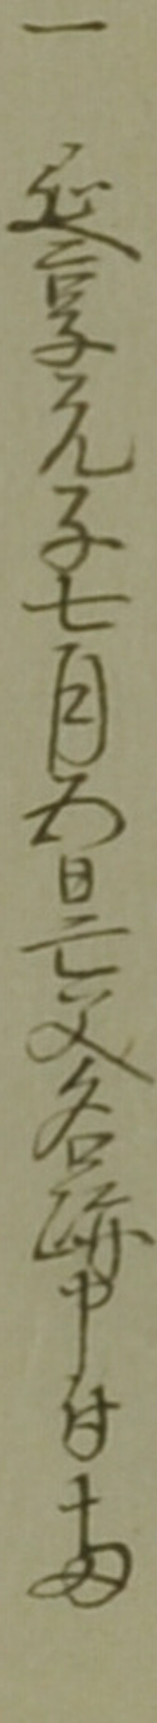一延享元子七月五日亡父名跡申付両
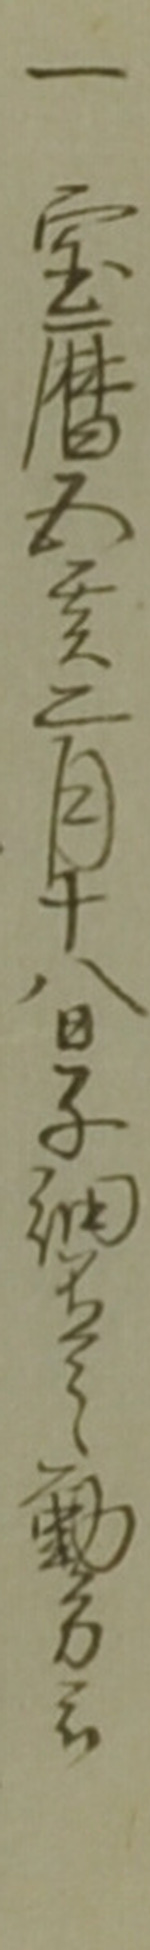一宝暦五亥二月十八日子細有之勤方被
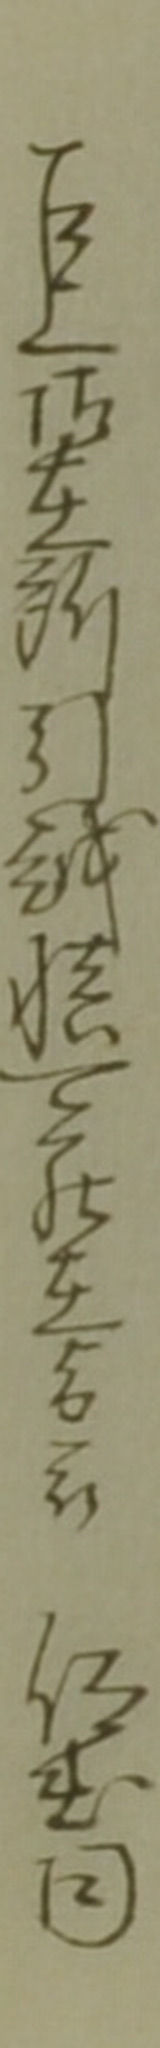召上御在所引越慎可罷在旨被仰出同
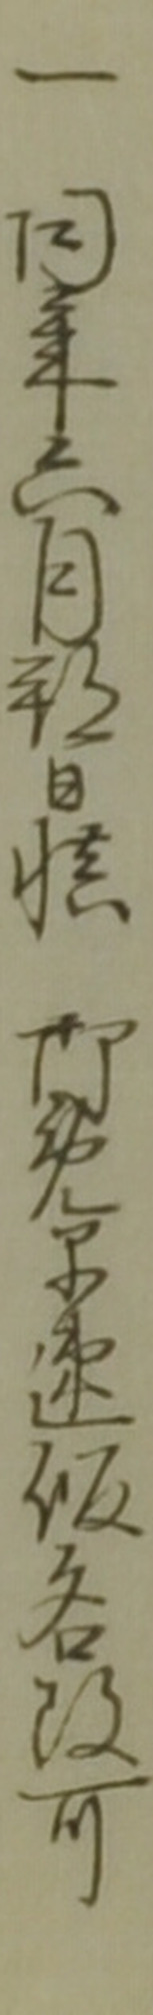一同年六月朔日慎御免早速帰名改可
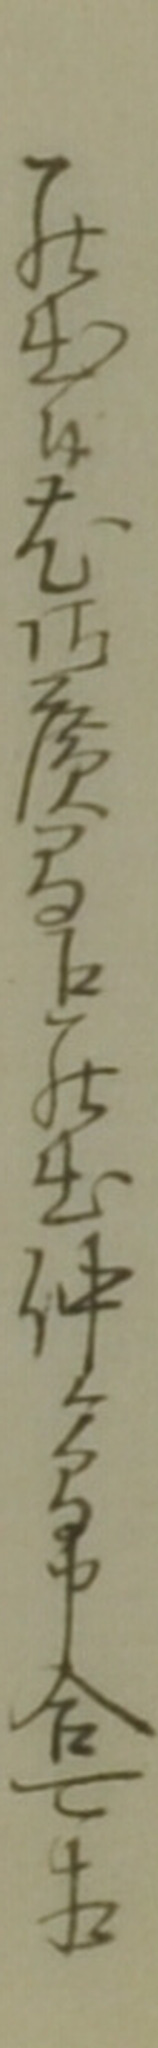罷出候尤御広間江罷出仲ヶ間申合可相
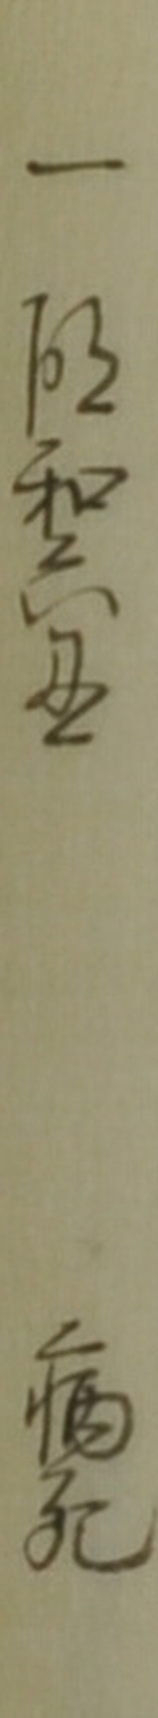一明和六丑病死
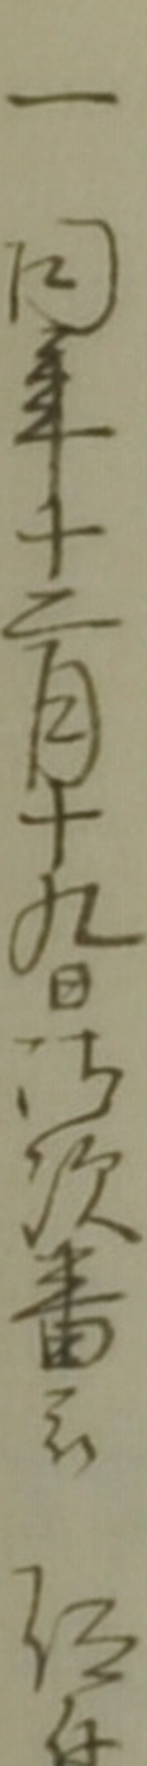一同年十二月十九日御次番被仰付
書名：無足諸士勤仕録（七）
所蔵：伊那市立高遠町図書館・合同会社AMANE
